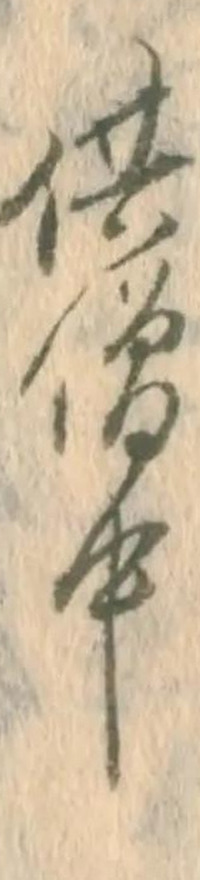供僧中
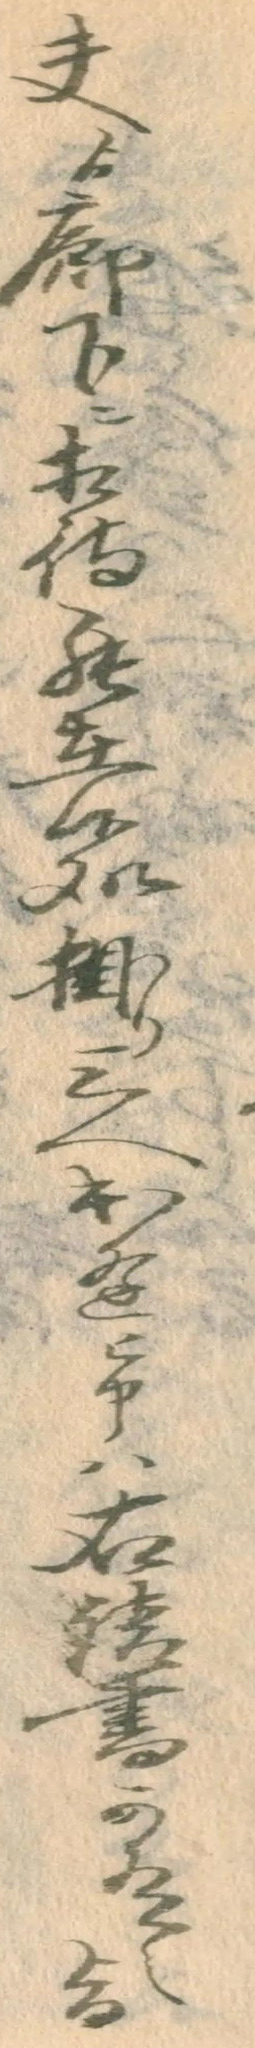夫ゟ廊下ニ相待罷在候処掛り三人出逢被申ハ右請書可有之旨
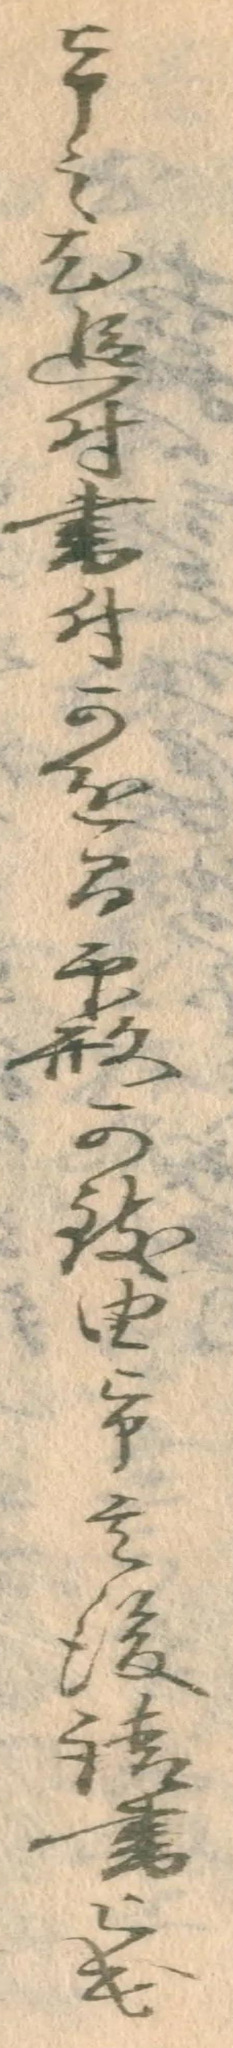被申之尤追付書付可遣間印形可致由被申其後請書被出
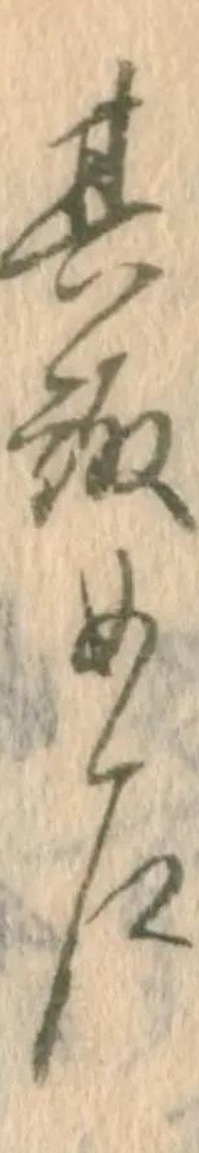其趣如左
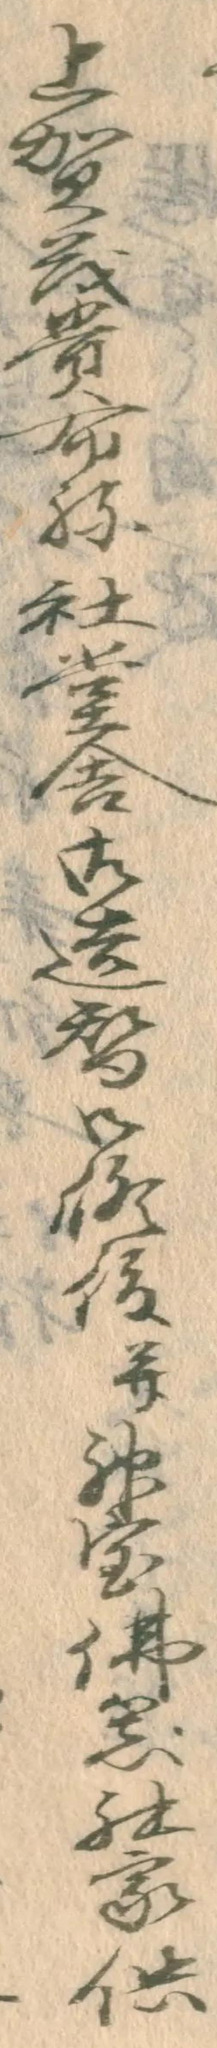上賀茂貴布祢社堂舎御造替御修復并神宝仏器社家供
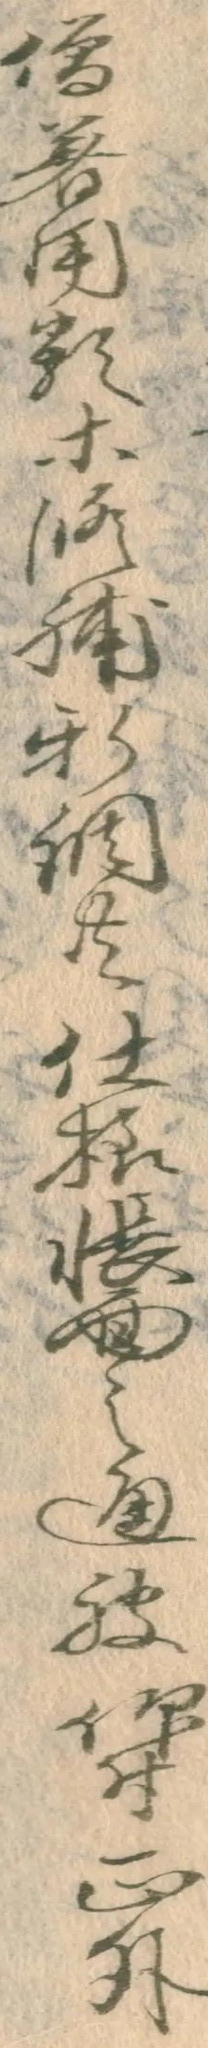僧着用類等修補新調共仕様帳面之通被仰付正外
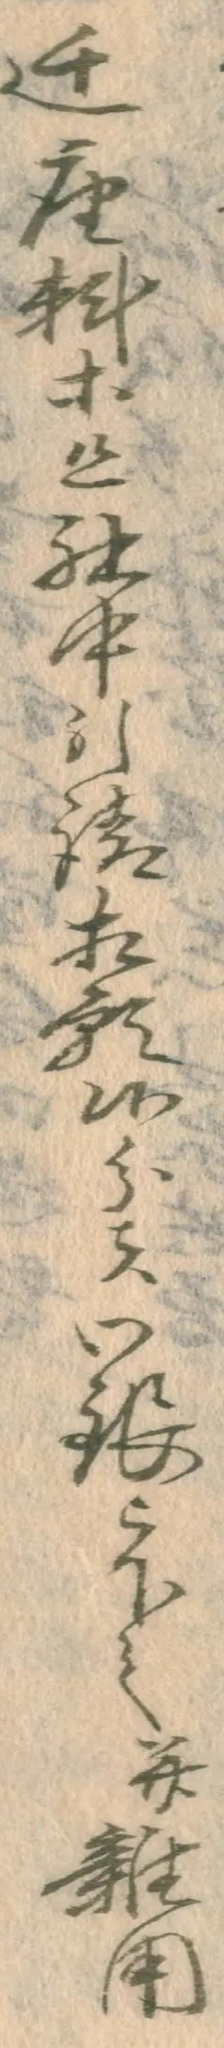迁座料等且社中引請相願候分は御銀被下之并雑用
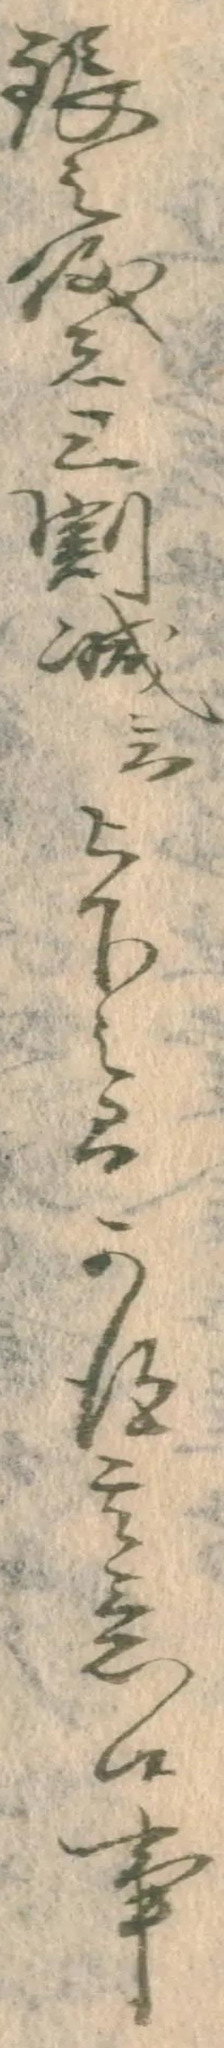銀之儀は三割減ニ而被下候間可得其意候事
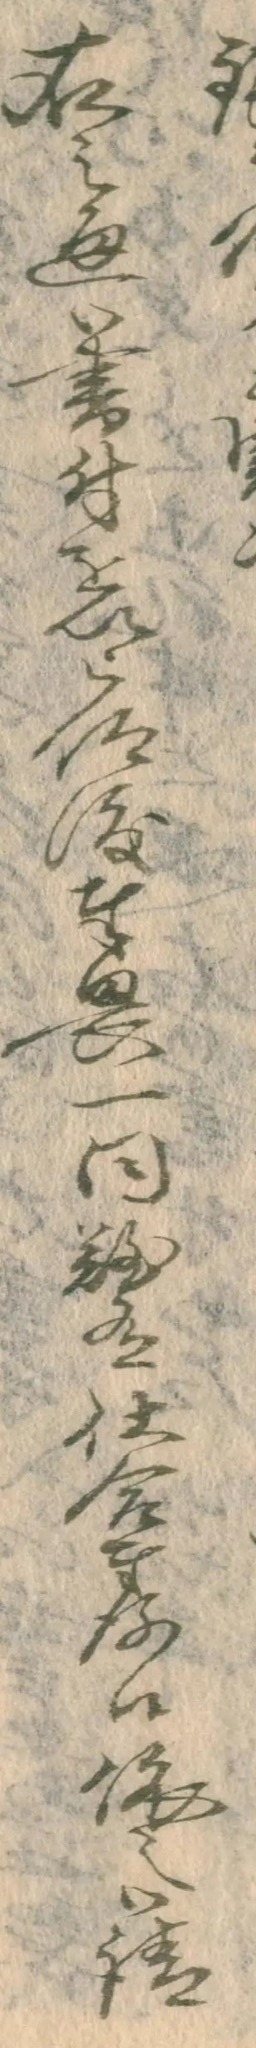右之通御書付を以被仰渡奉畏一同難有仕合奉存候依之御請
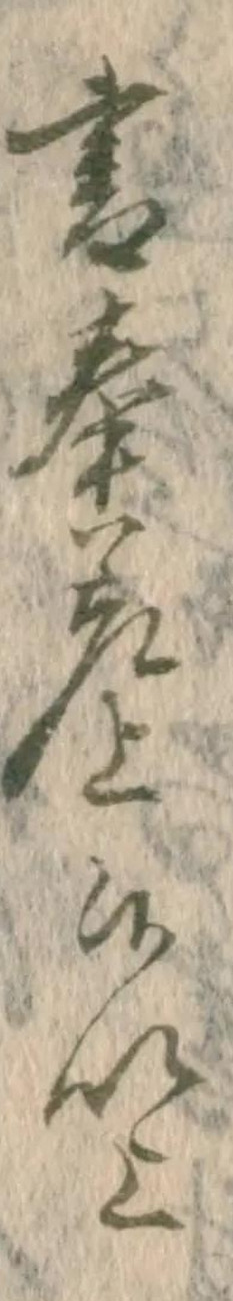書奉差上候以上
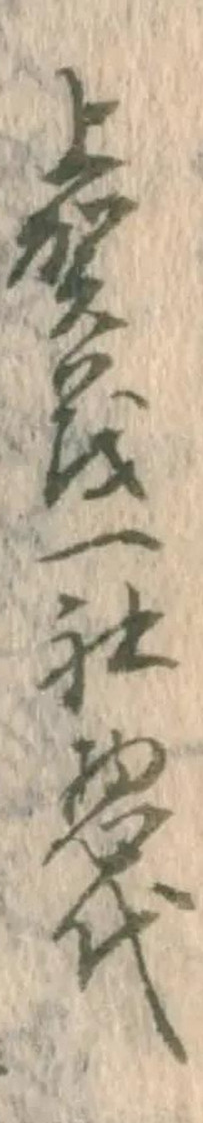上賀茂一社惣代
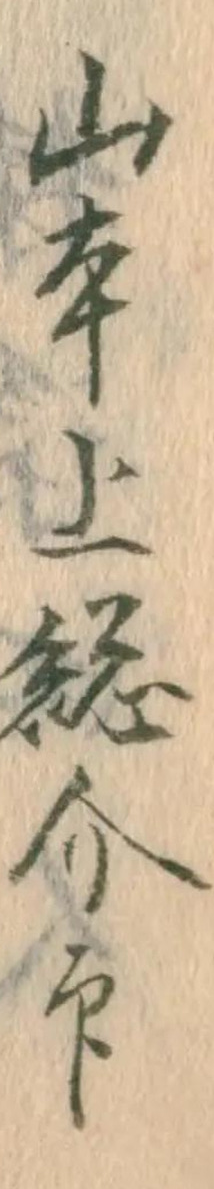山本上総介印
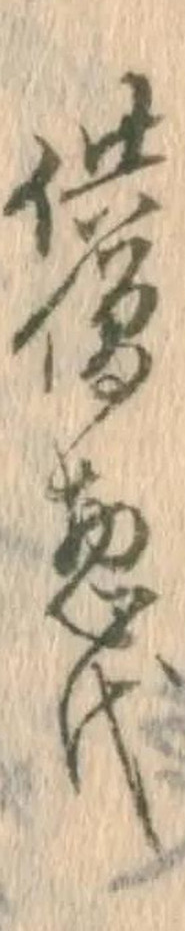供僧惣代
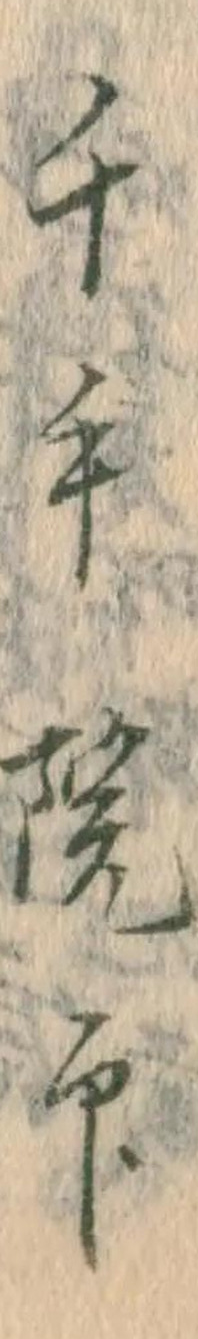千手院印
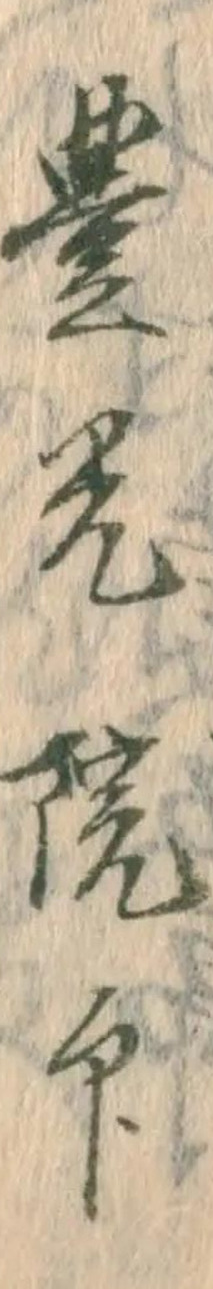豊光院印
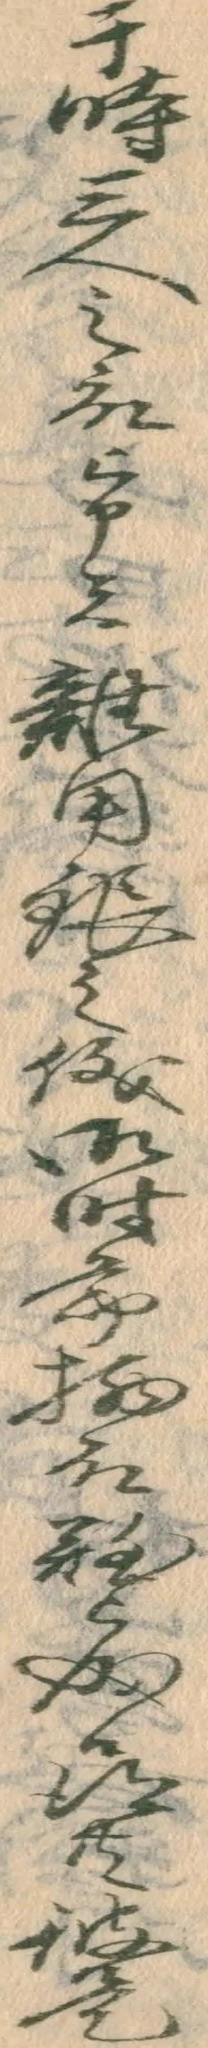于時三人之衆被申は雑用銀之儀御時節柄故難被成候得共彼是
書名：賀茂社記録. 第17冊
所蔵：国立国会図書館 National Diet Library, JAPAN
